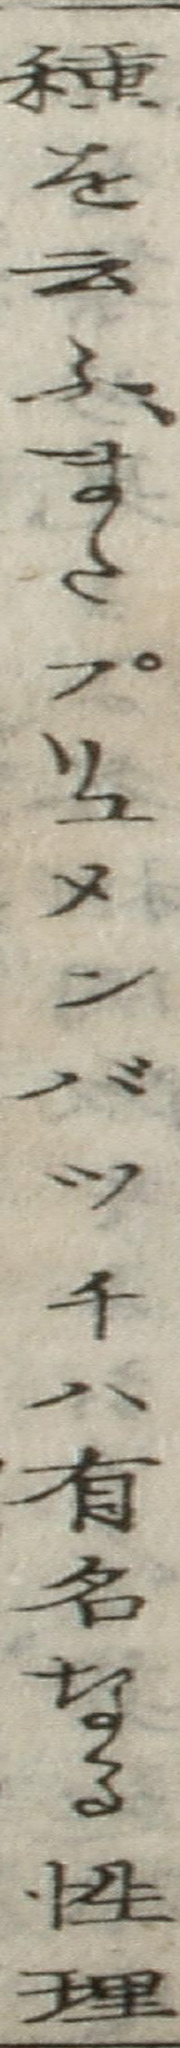種を云ふ、またプリュメンバツチは有名なる性理
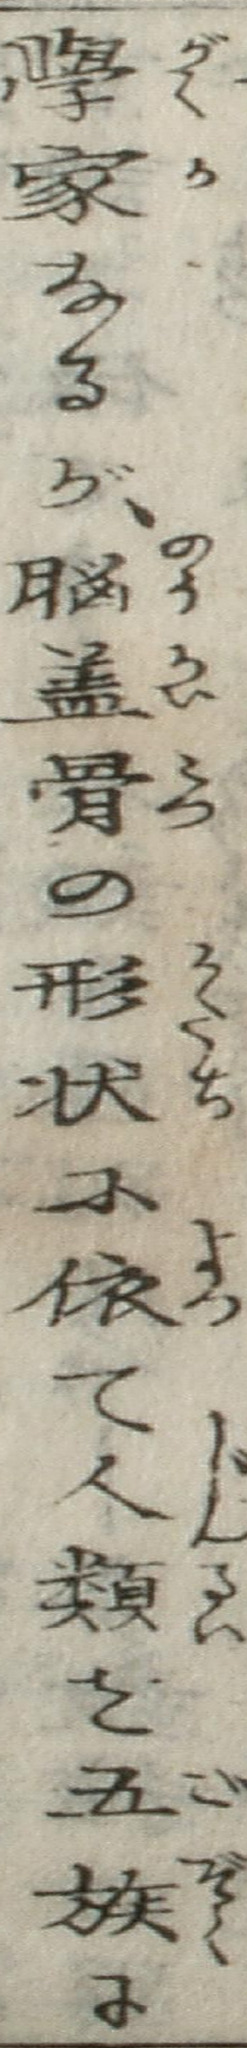学家なるが、脳蓋骨の形状に依て人類を五族に
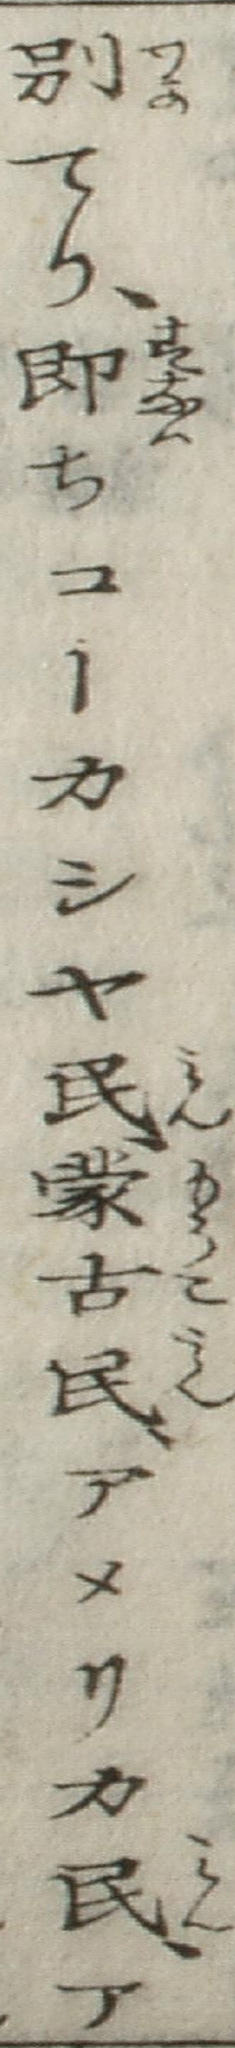別てり、即ちコーカシヤ民蒙古民、アメリカ民ア
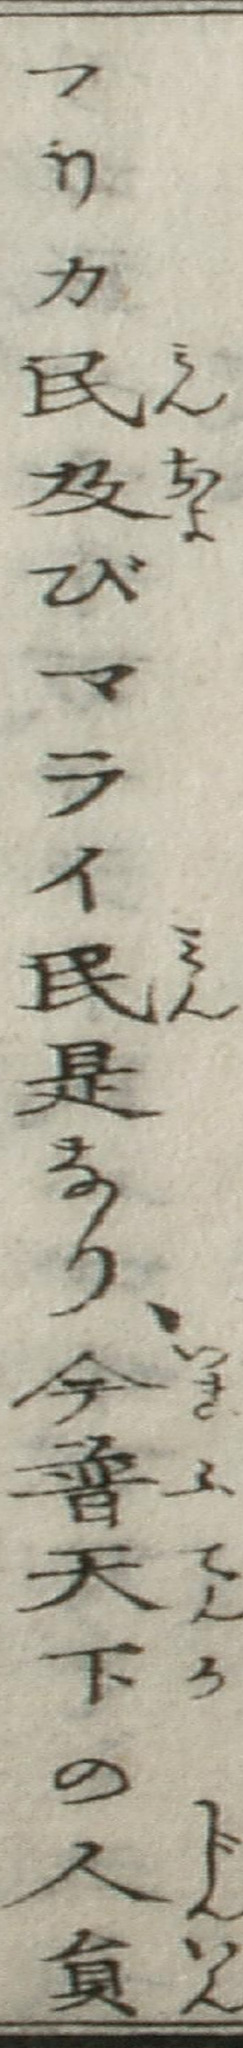フリカ民及びマライ民是なり、今普天下の人員
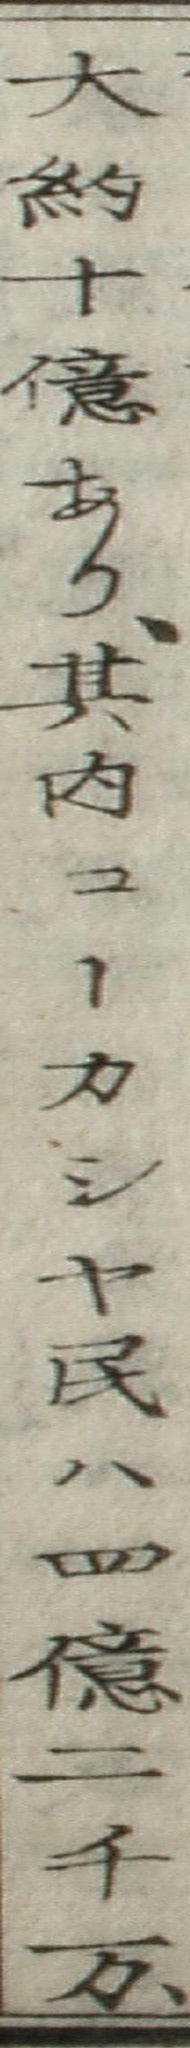大約十億あり、其内コーカシヤ民は四億二千万、

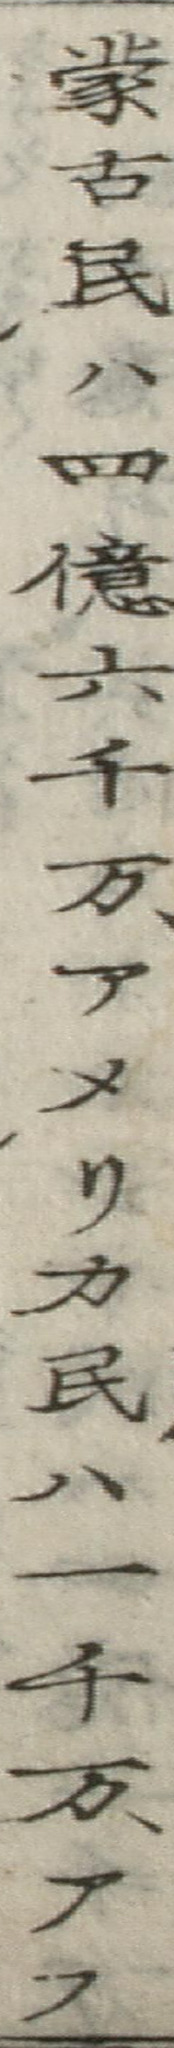蒙古民は四億六千万、アメリカ民は一千万、アフ
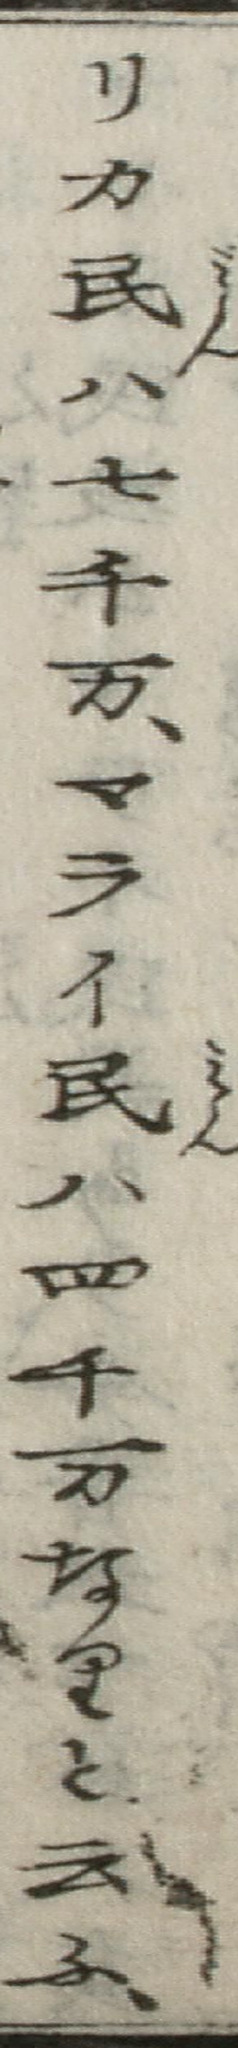リカ民は七千万、マライ民は四千万なりと云ふ、
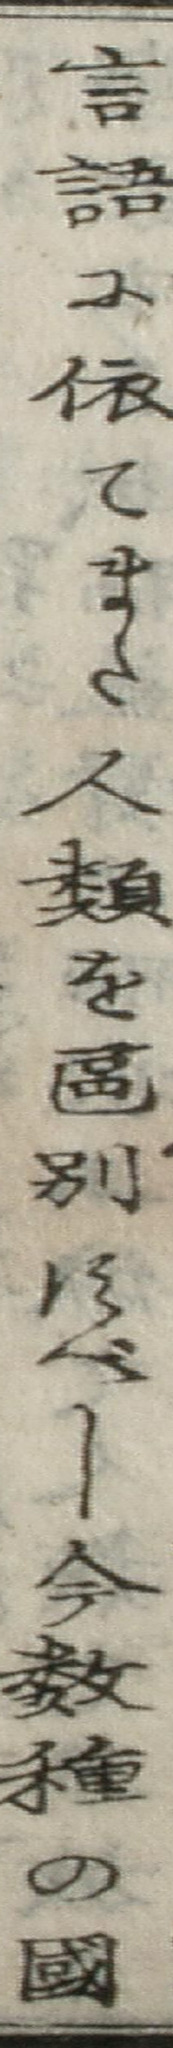言語に依てまた人類を区別すべし今数種の国
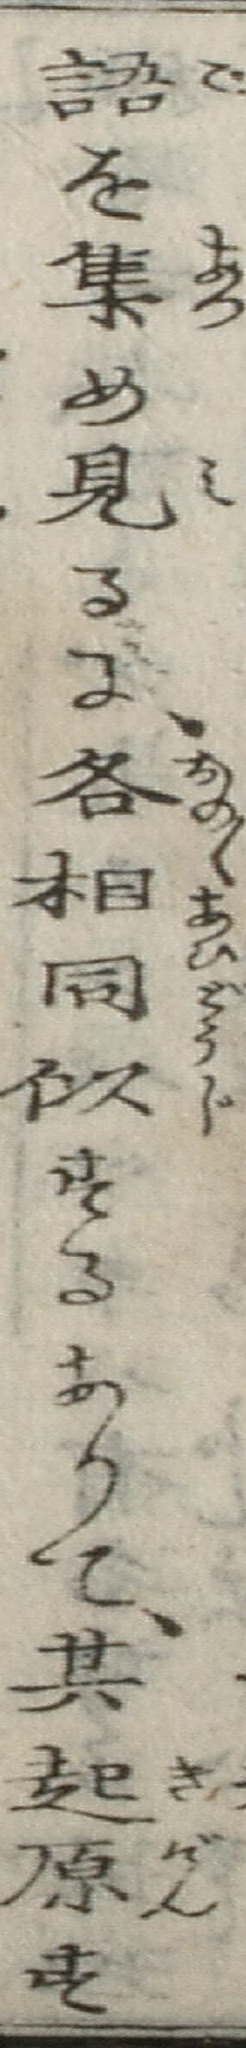語を集め見るに、各相同似するありて、其起原す
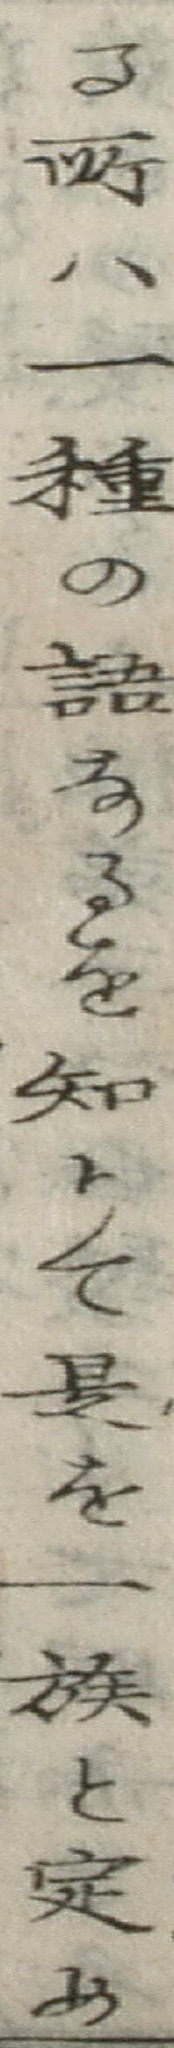る所は一種の語なるを知りて是を一族と定め
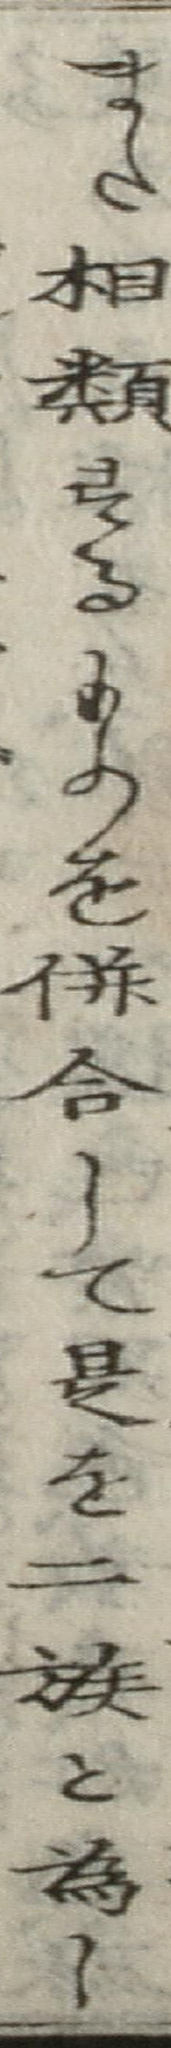また相類するものを併合して是を二族と為し
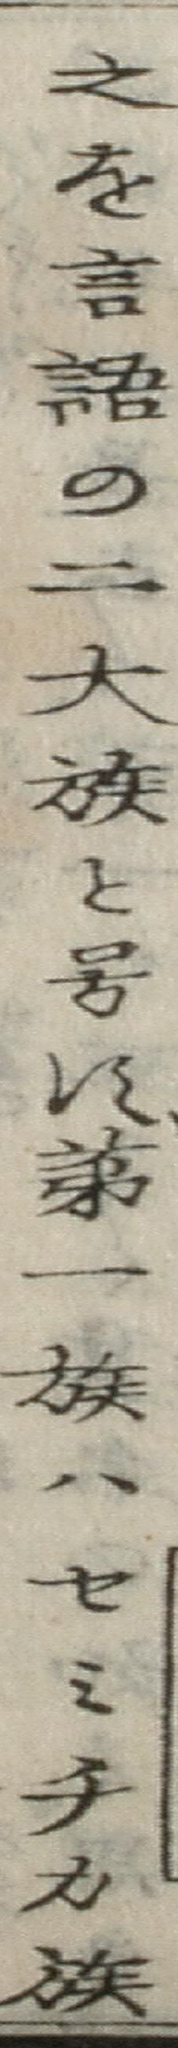之を言語の二大族と号す、第一族はセミチカ族
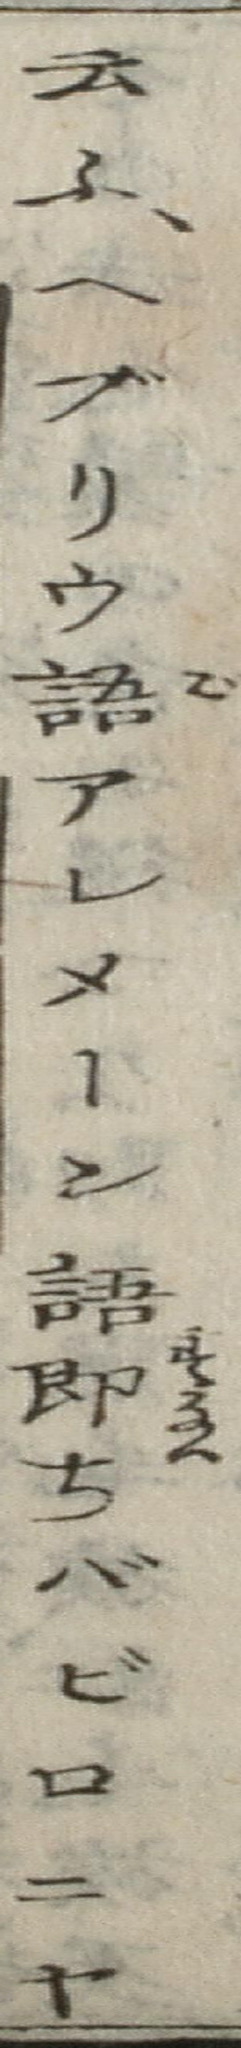云ふ、ヘブリウ語アレメーン語即ちバビロニヤ
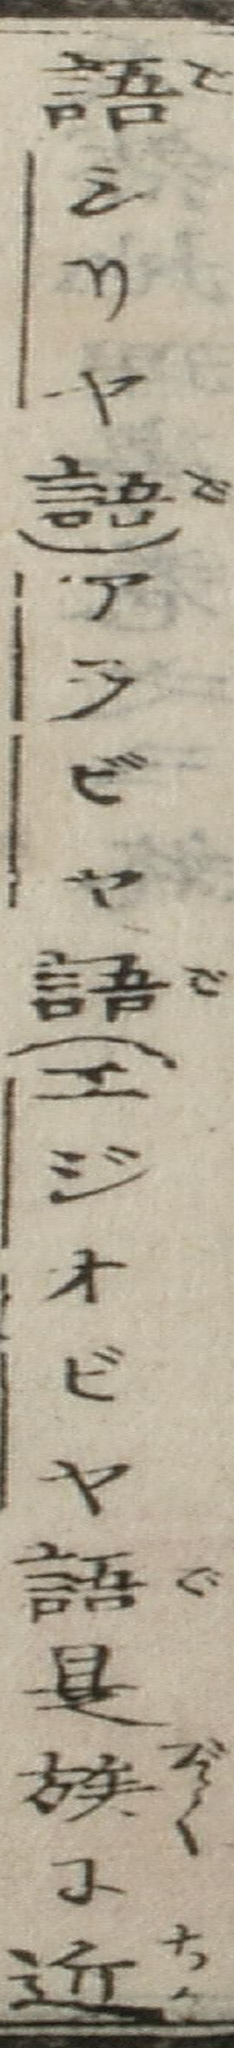語シリヤ語）アラビヤ語是族に近
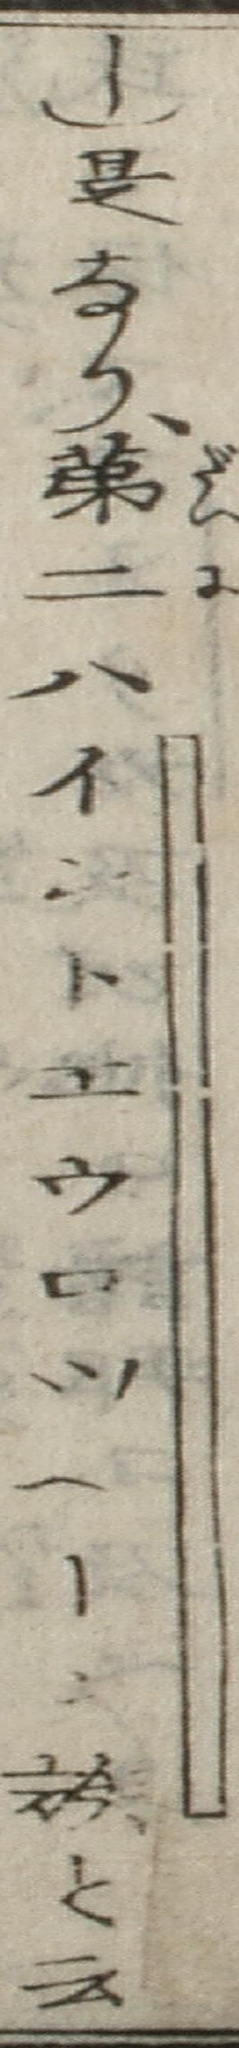し）是なり、第二はインドエウロツヘーン族と云
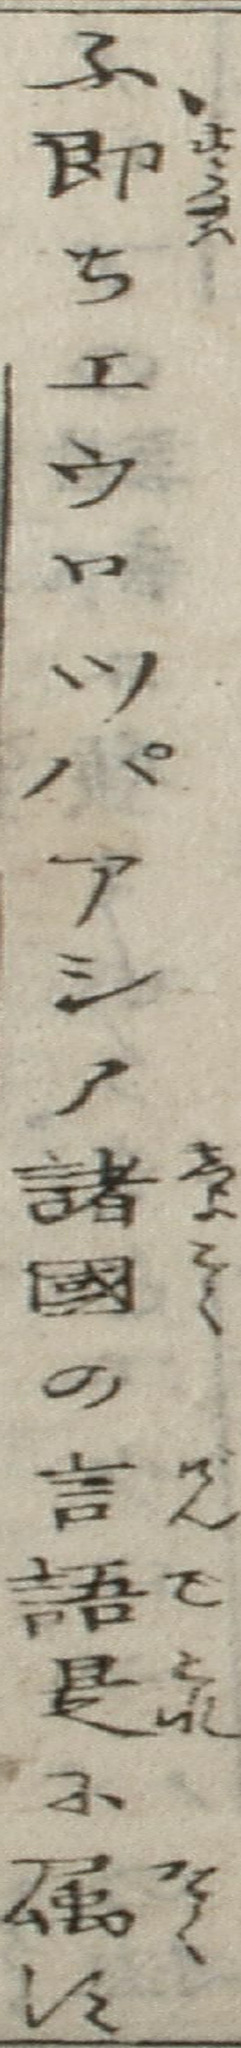ふ、即ちエウロツパアシア諸国の言語是に属す
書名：訓蒙　天然地理學　下
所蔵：東京大学地震研究所図書室 Earthquake Research Institute Library, The University of Tokyo, JAPAN
